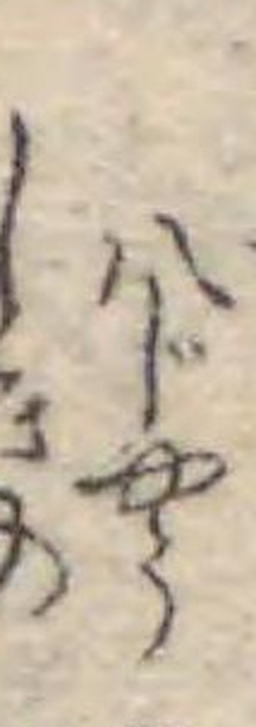しきの
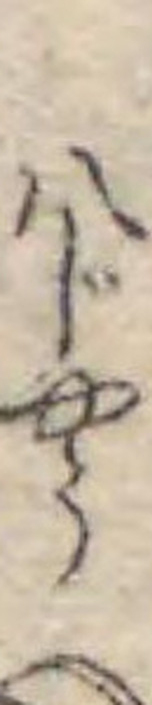八じやう
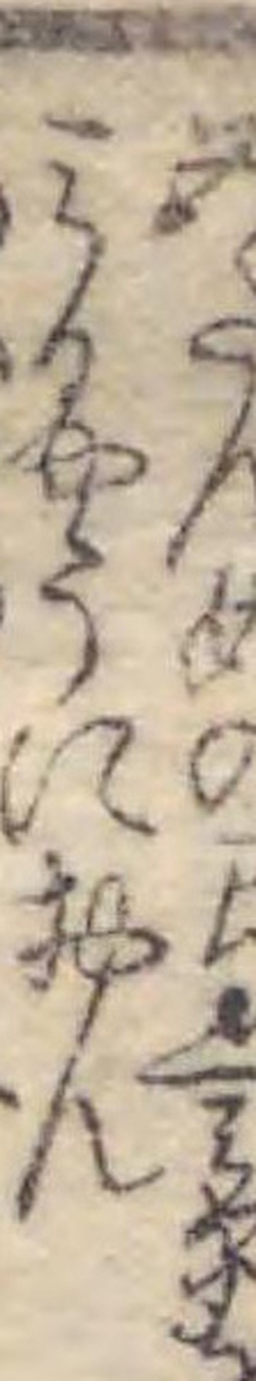みるやうにおん
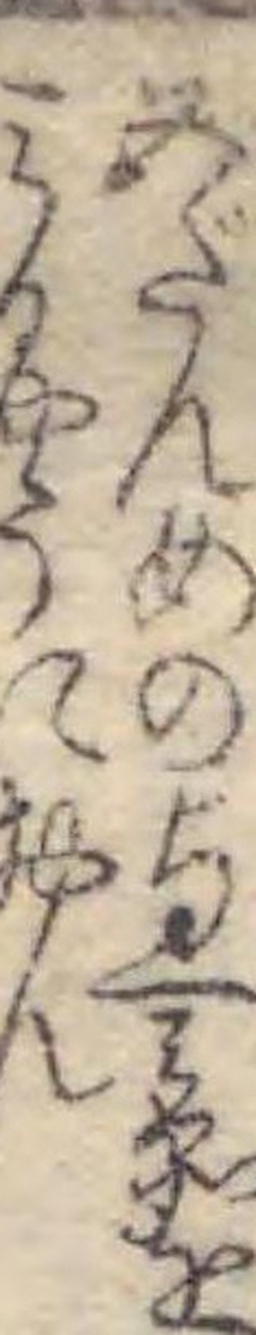みるやうにおん
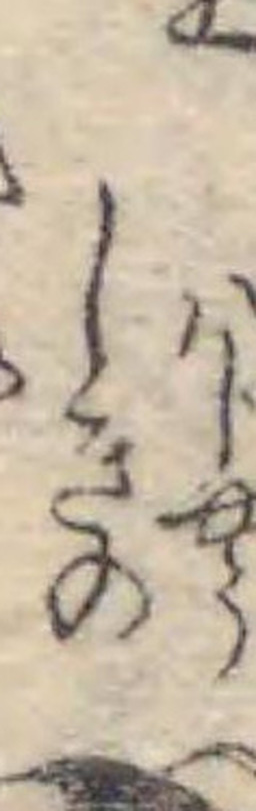しきの
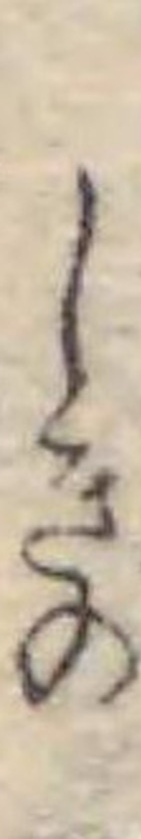しきの
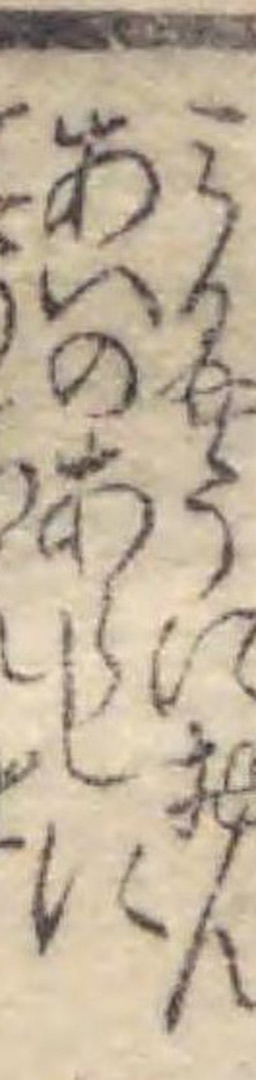あいのあらしに
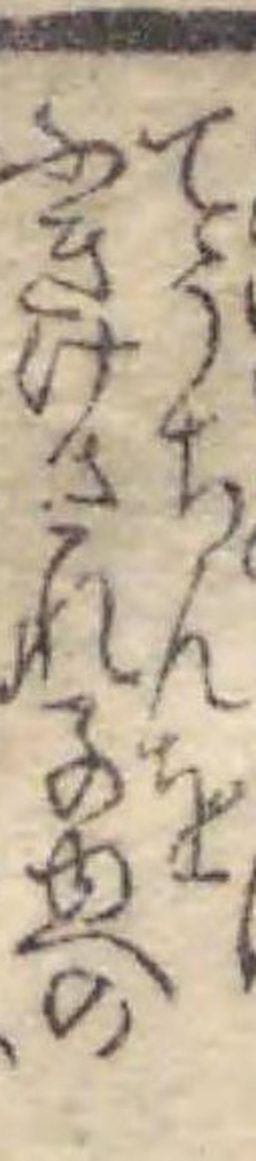ふきけされ子ゆへの
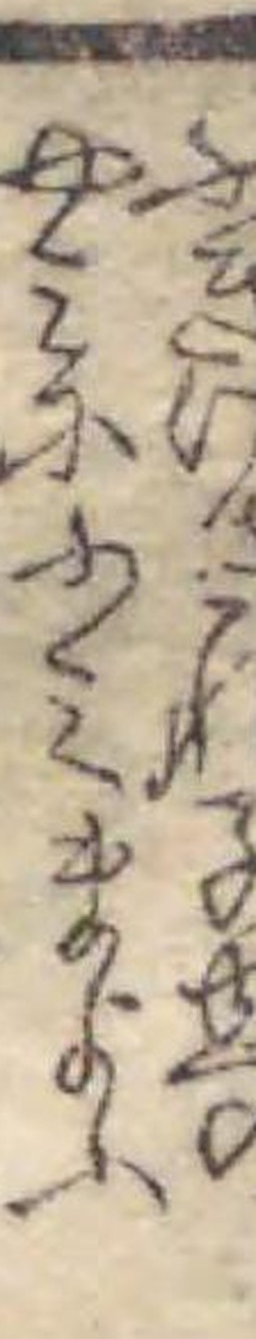やみにふみまよふ
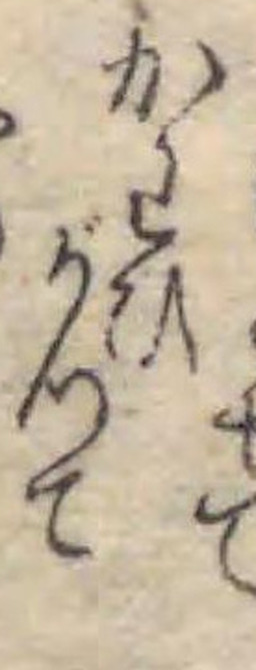がつて
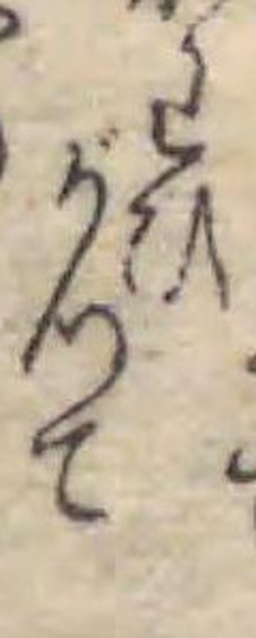がつて
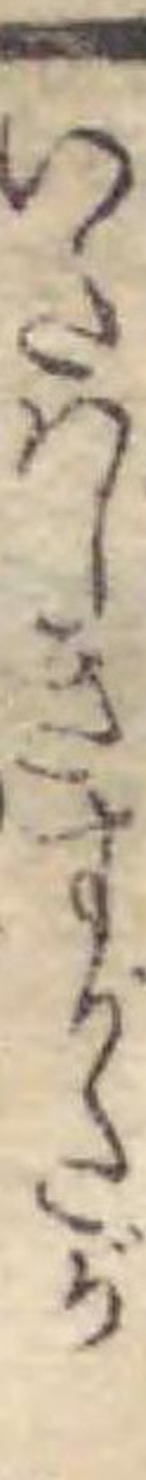いたはしきすがたが
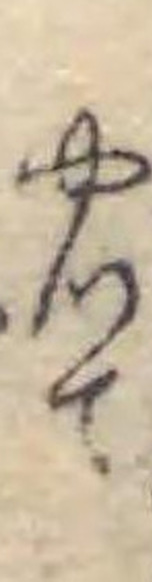やつて
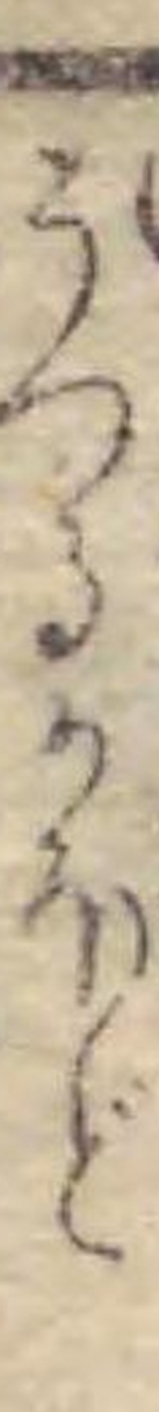うつるかほど
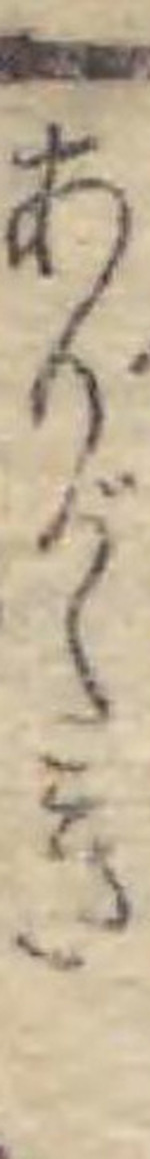ありがたき
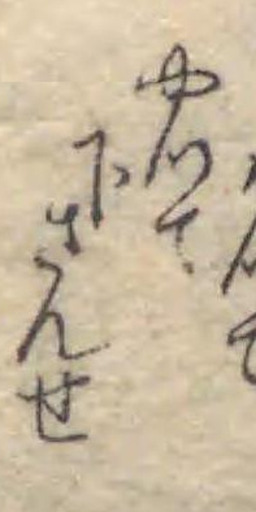下さんせ
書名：人心鏡写絵 : 3巻
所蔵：国立国会図書館 National Diet Library, JAPAN
